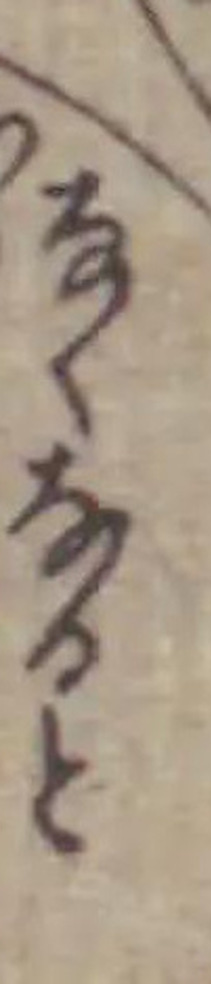なくなると
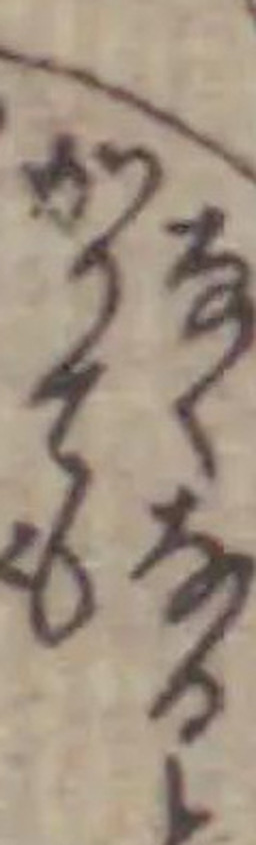かりても
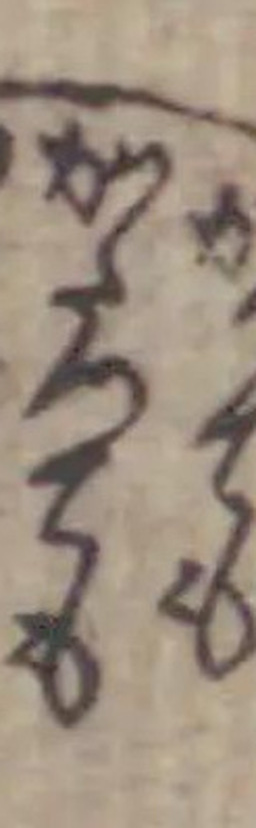かたつても
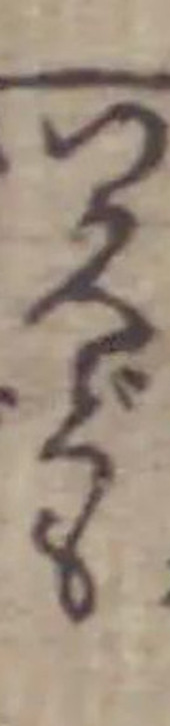つかへども
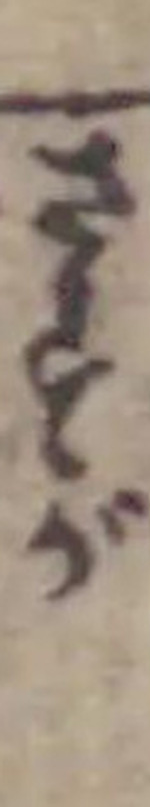さすが
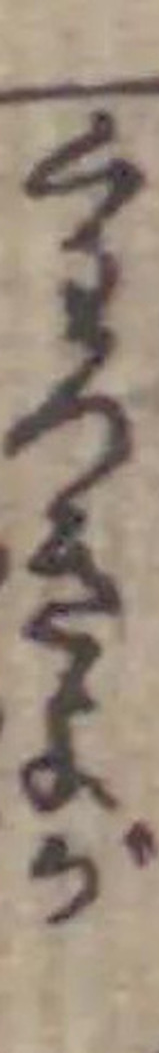くわつきよが
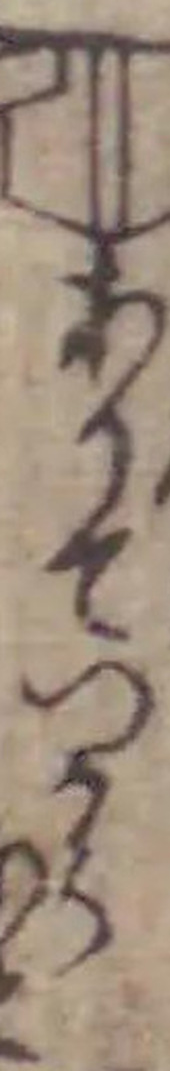ありてつかう
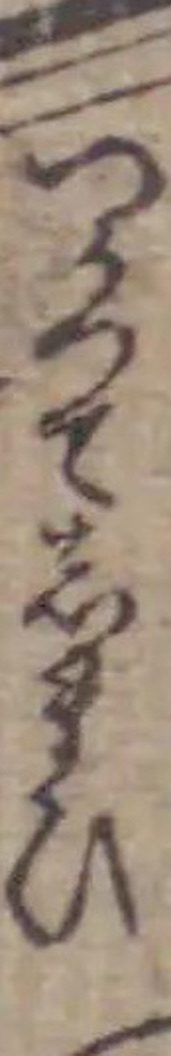つかつてしまひ
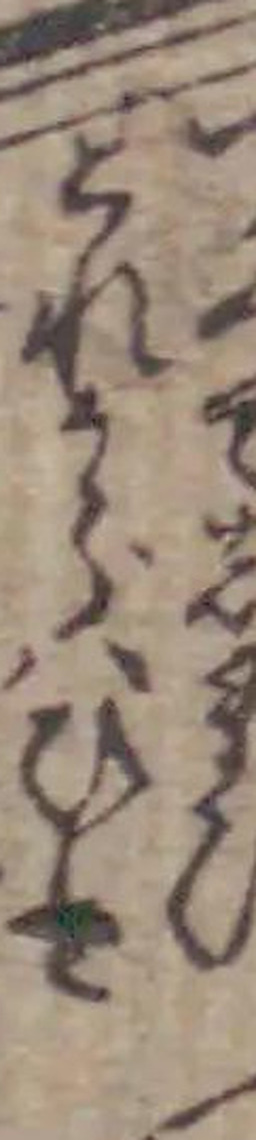これからはひと
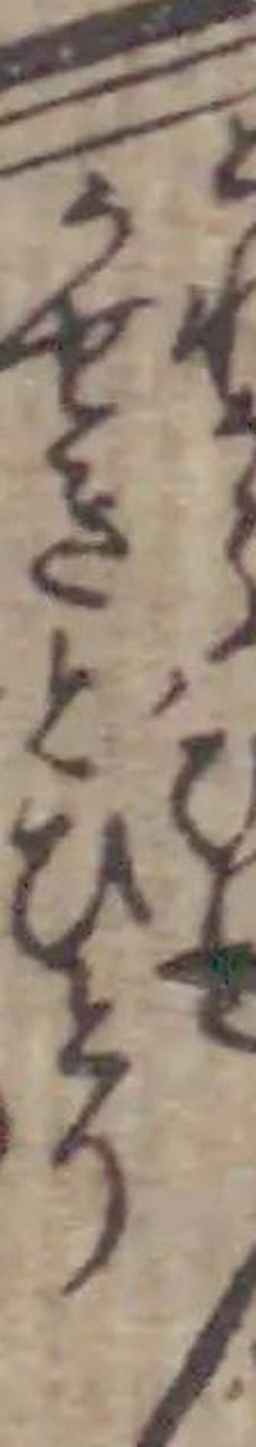かせきとひとり
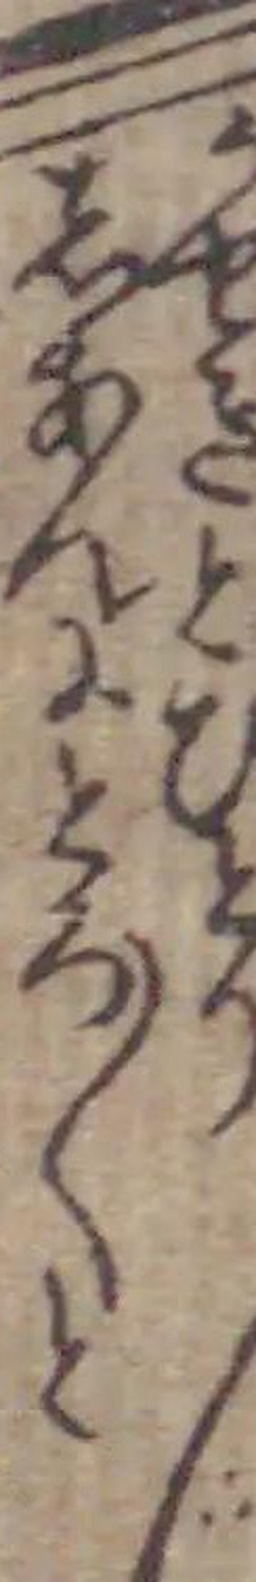しあんにとろ〳〵と
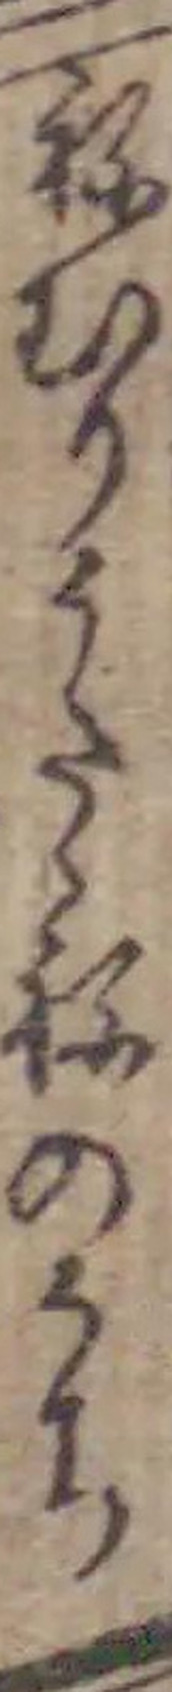ねむりうたゝねのうち
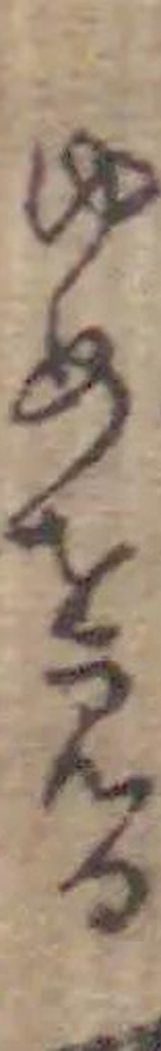ゆめを見る

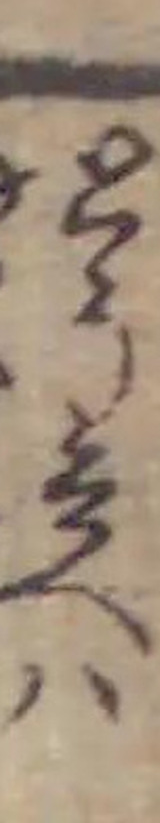とう兵へは
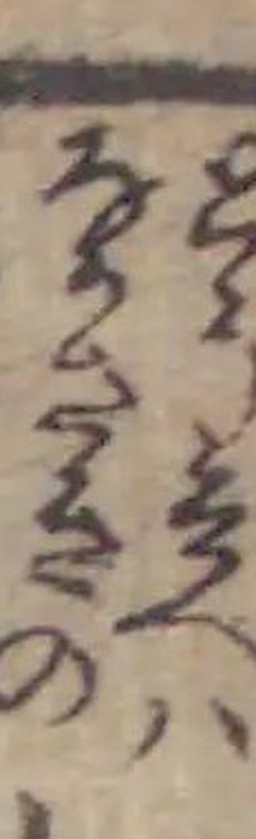なかさきの
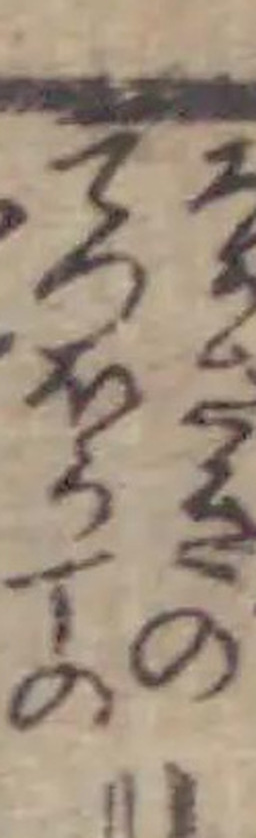てつほう丁の
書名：間違月夜鍋 2巻
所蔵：国立国会図書館 National Diet Library, JAPAN
